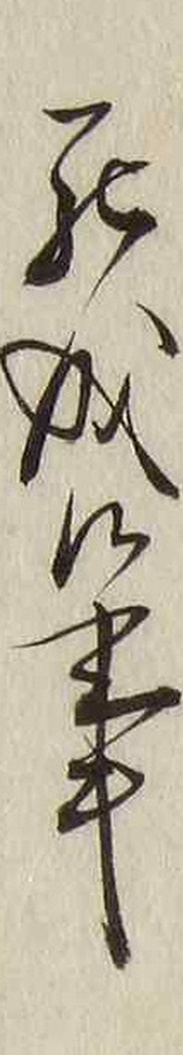罷成候事
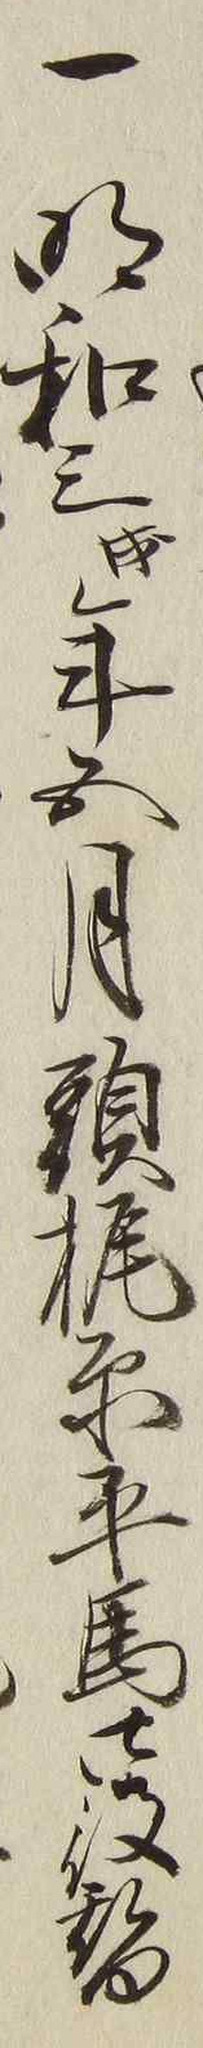一明和三戌年五月頭梶原平馬御役替
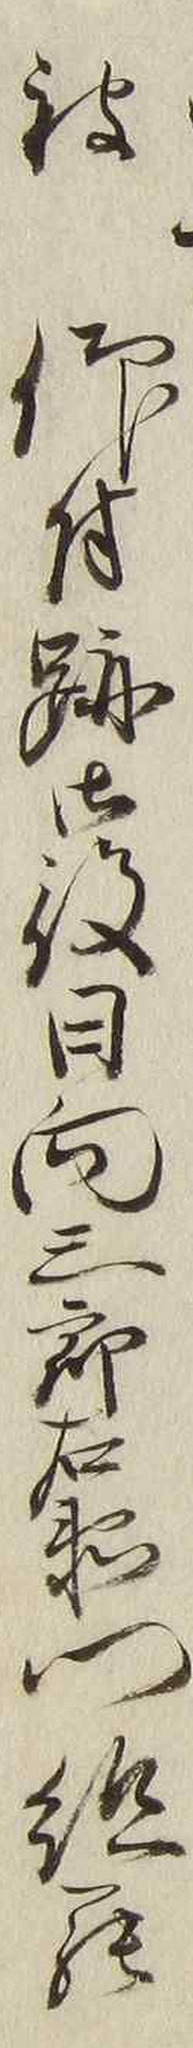被仰付跡御役日向三郎右衛門組罷

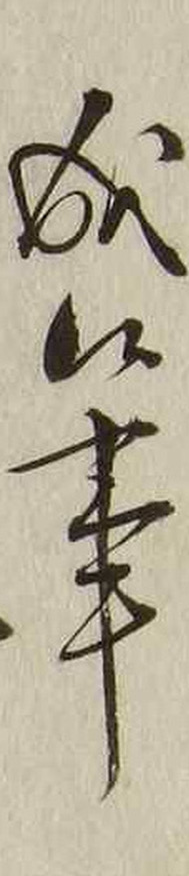成候事
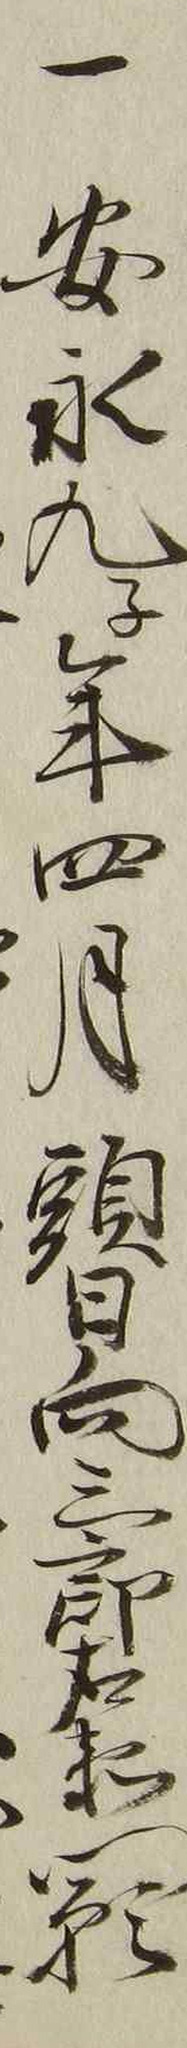一安永九子年四月頭日向三郎右衛門願
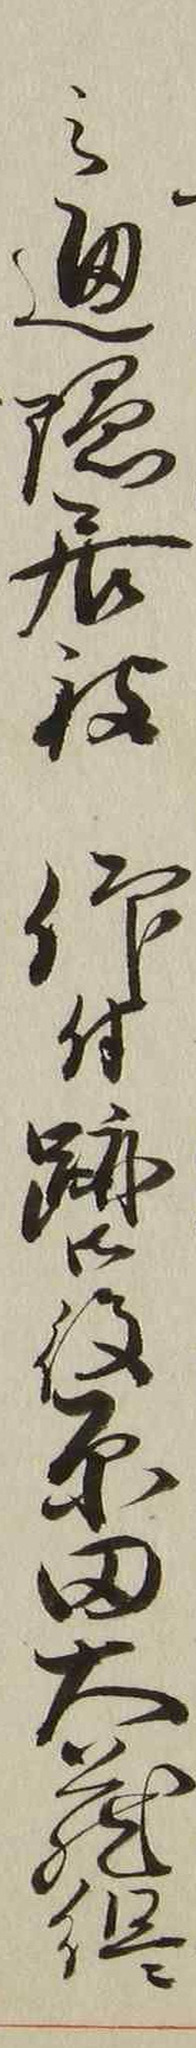之通隠居被仰付跡御役原田大蔵組に
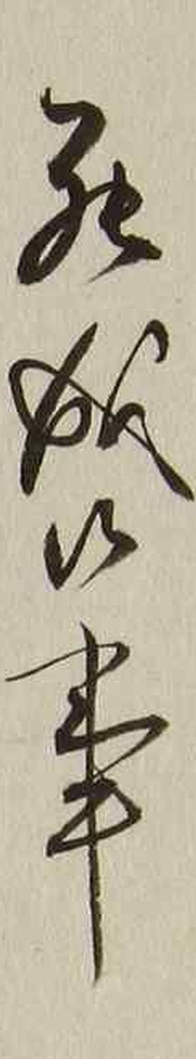罷成候事
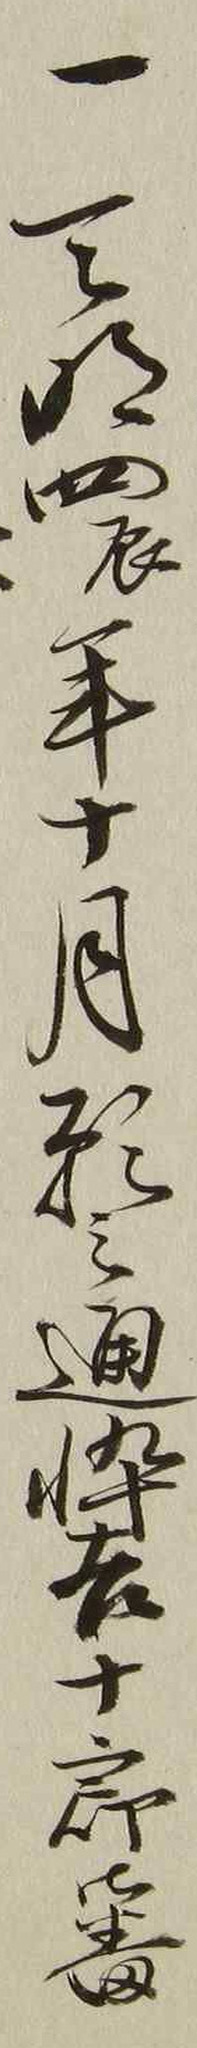一天明四辰年十月願之通悴吉十郎御番
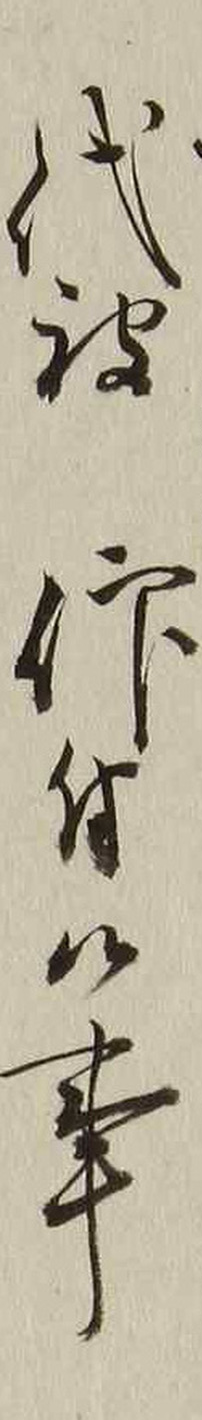代被仰付候事
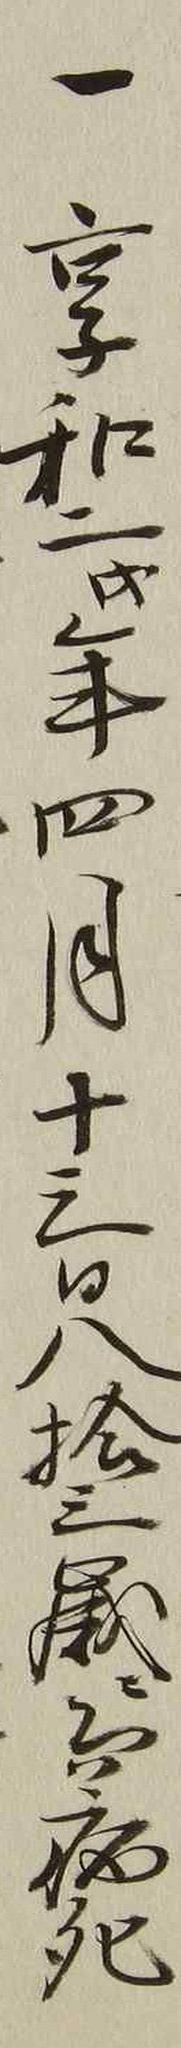一享和二戌年四月十三日八拾三歳に而病死
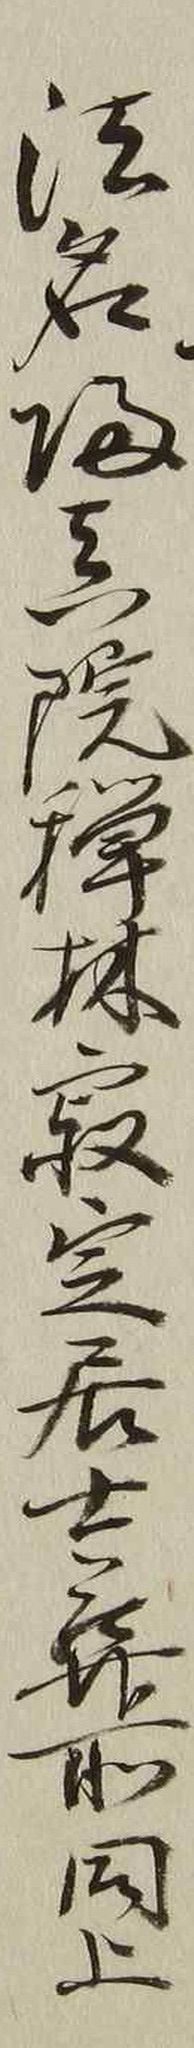法名帰真院禅林寂定居士葬所同上
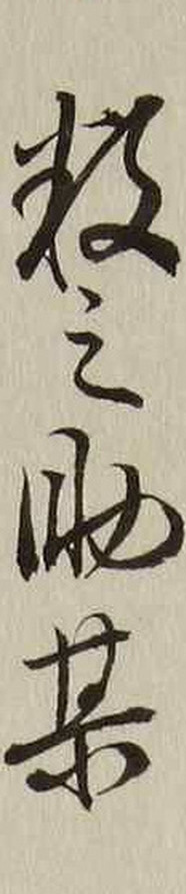数之助某
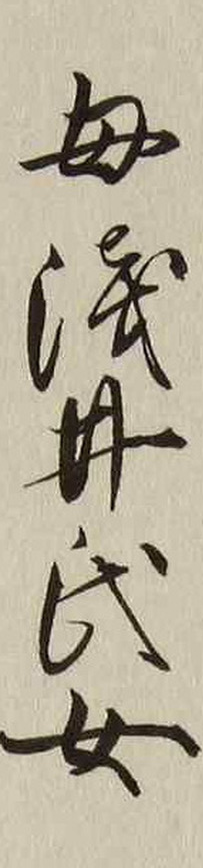母浅井氏女
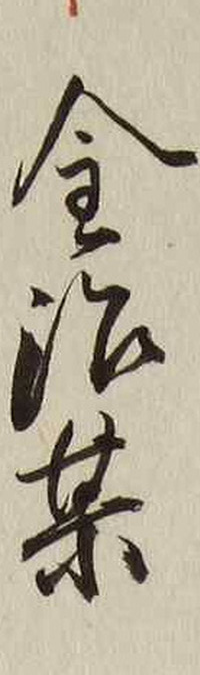金治某
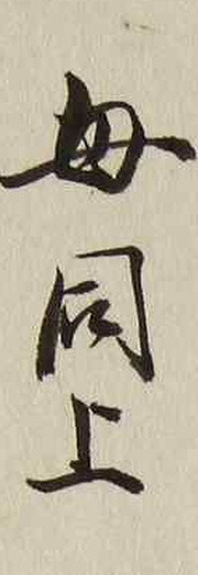母同上
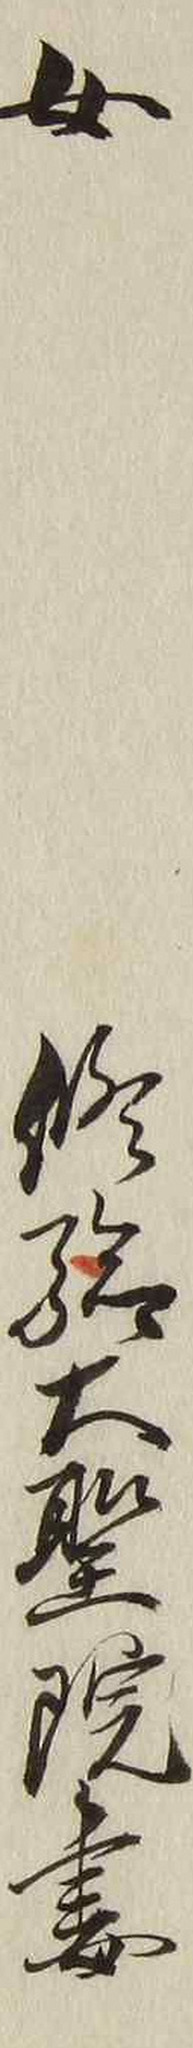女修験大聖院妻
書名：諸士系譜　巻之157　ね之部1
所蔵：会津若松市立会津図書館
